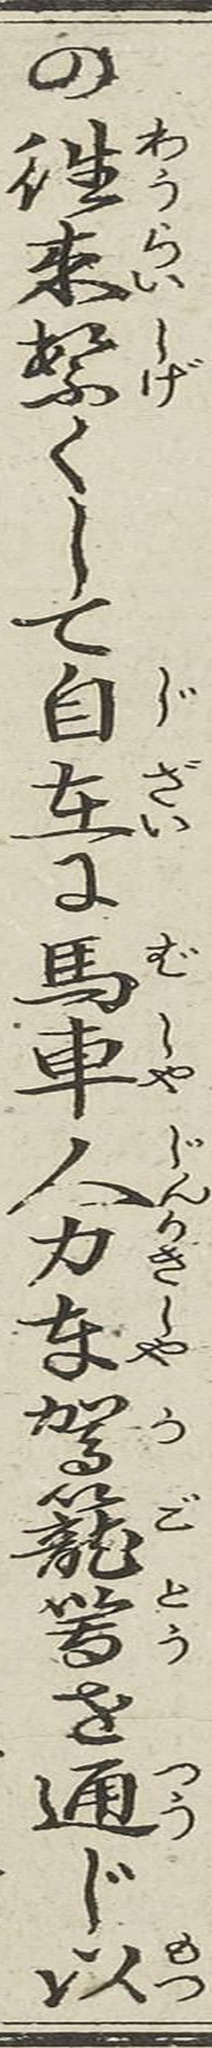の往来繁くして自在に馬車人力車駕籠等を通じ以
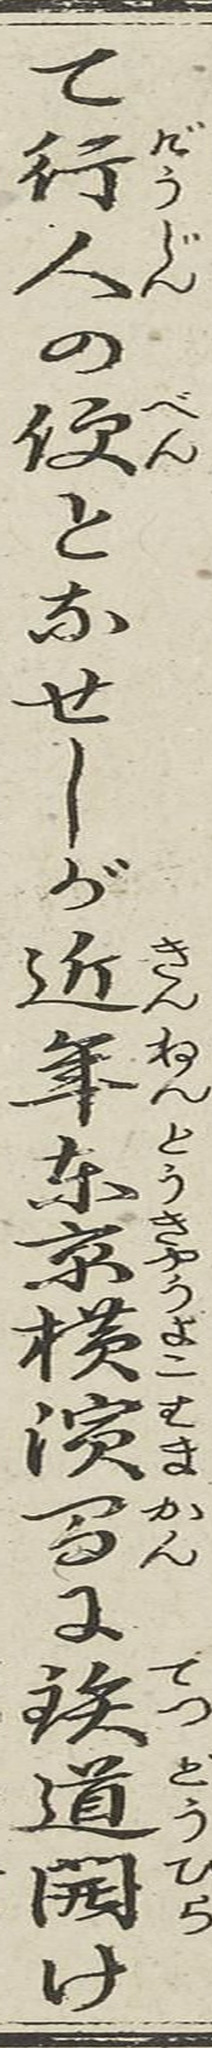て行人の便となせしが近年東京横浜間に鉄道開け
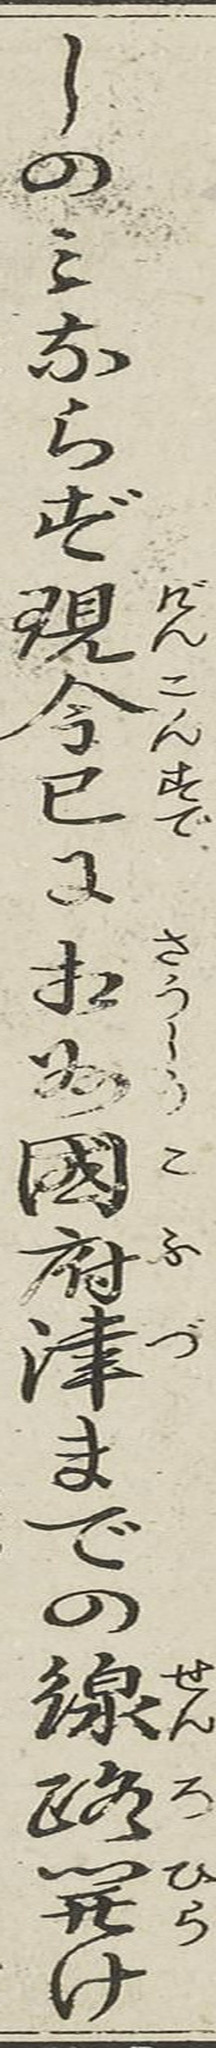しのみならず現今已に相州国府津までの線路開け
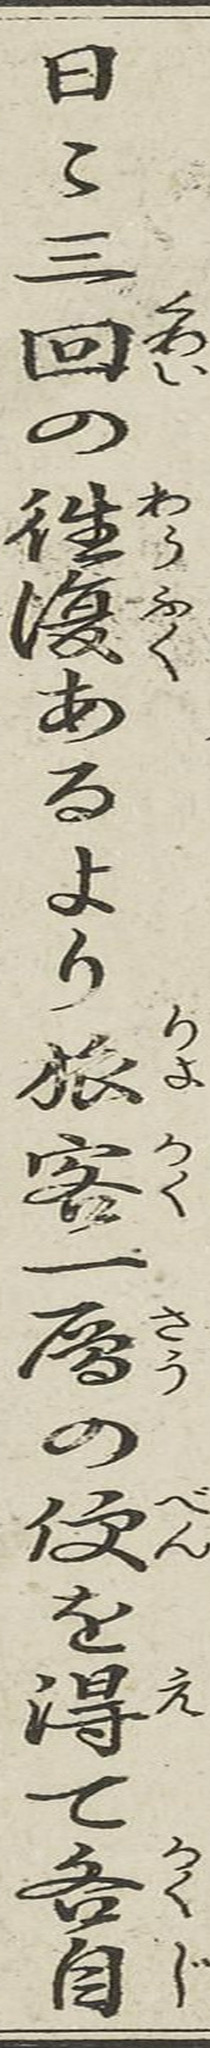日々三回の往復あるより旅客一層の便を得て各自
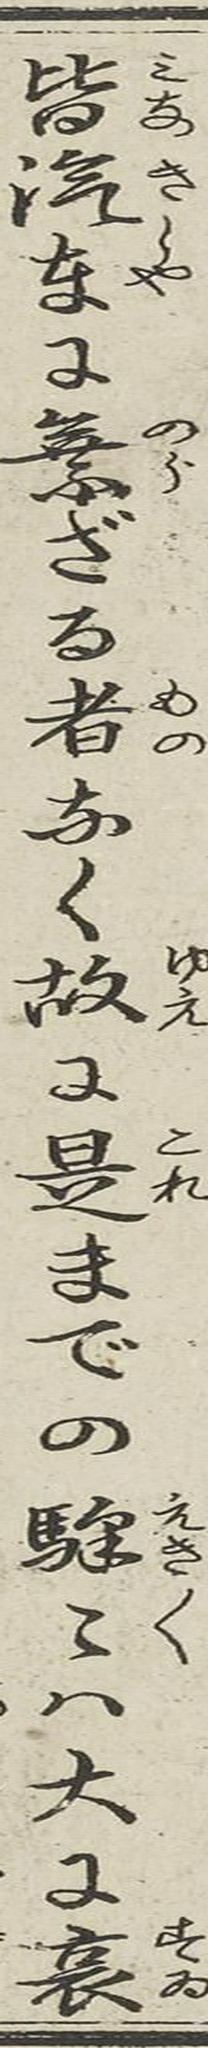皆汽車に乗ざる者なく故に是までの駅々は大に衰
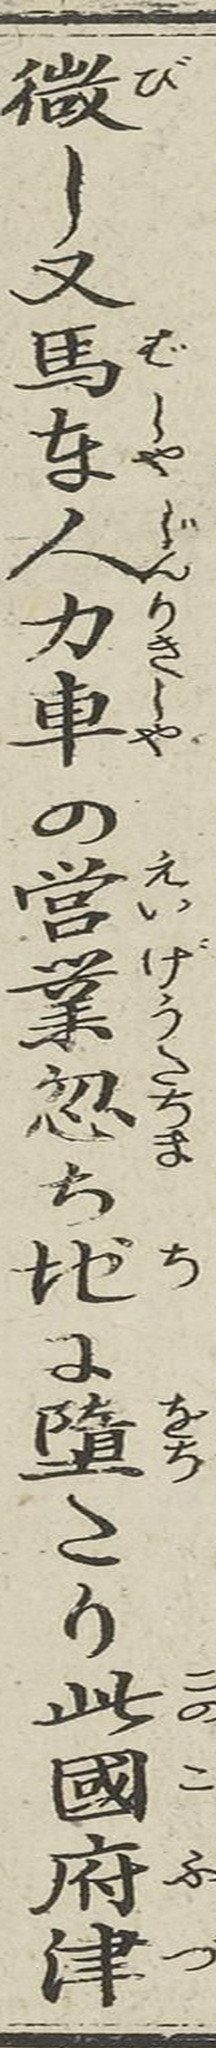微し又馬車人力車の営業忽ち地に堕たり此国府津

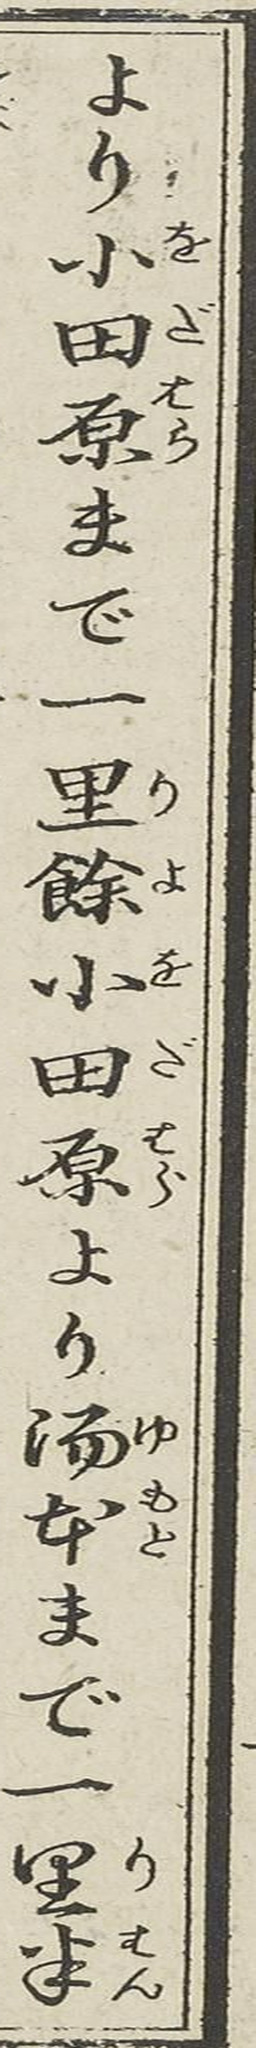より小田原まで一里餘小田原より湯本まで一里半
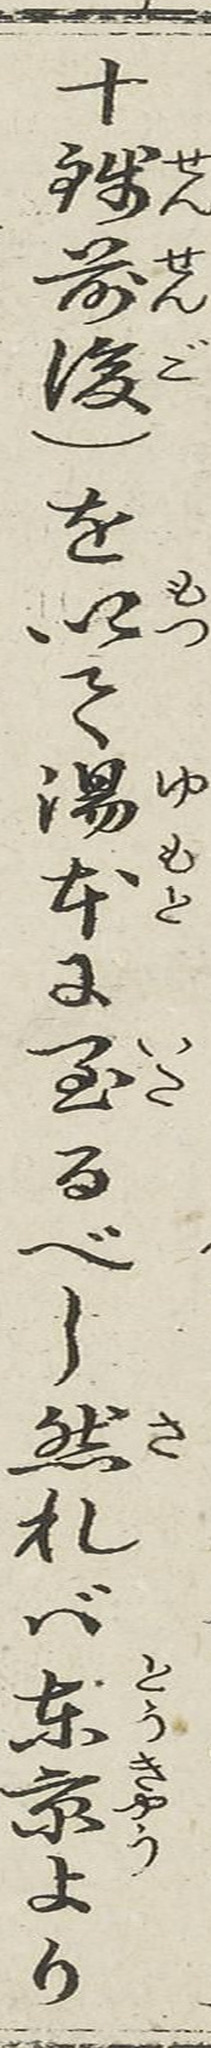十銭前後）を以て湯本まで至るべし然れバ東京より
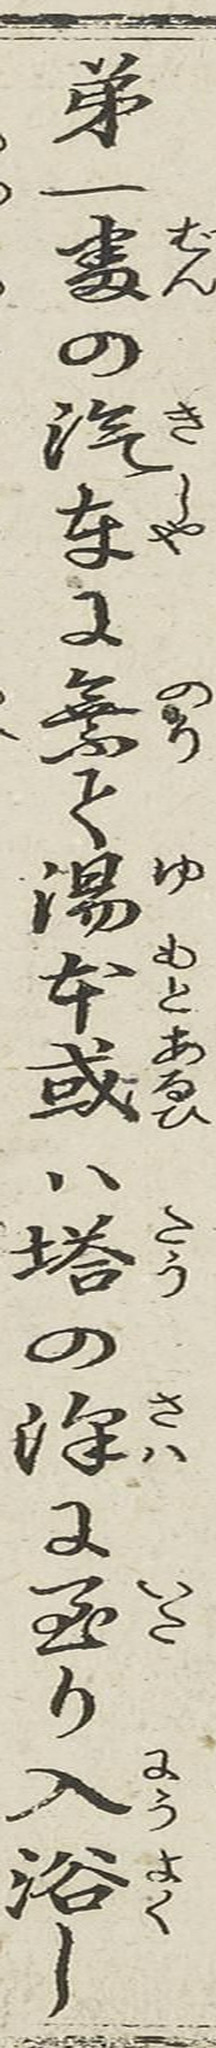第一番の汽車に乗て湯本或は塔の沢に至り入浴し
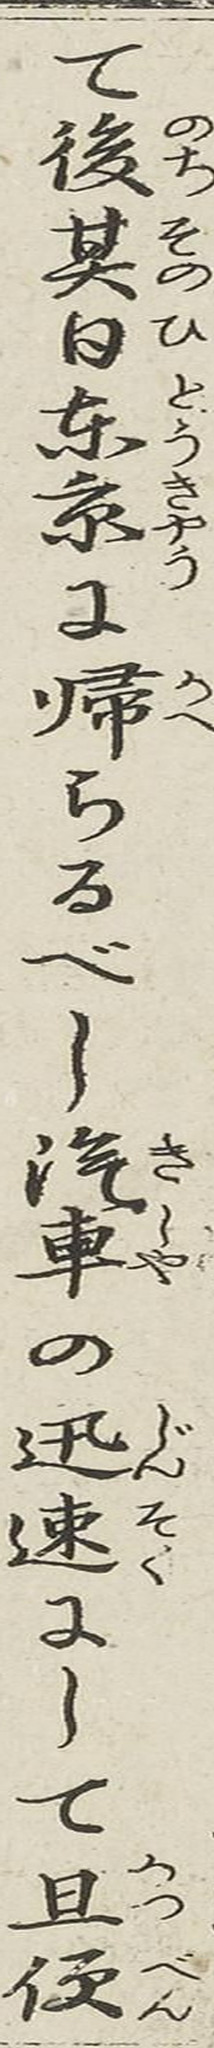て後其日東京に帰らるべし汽車の迅速にして且便
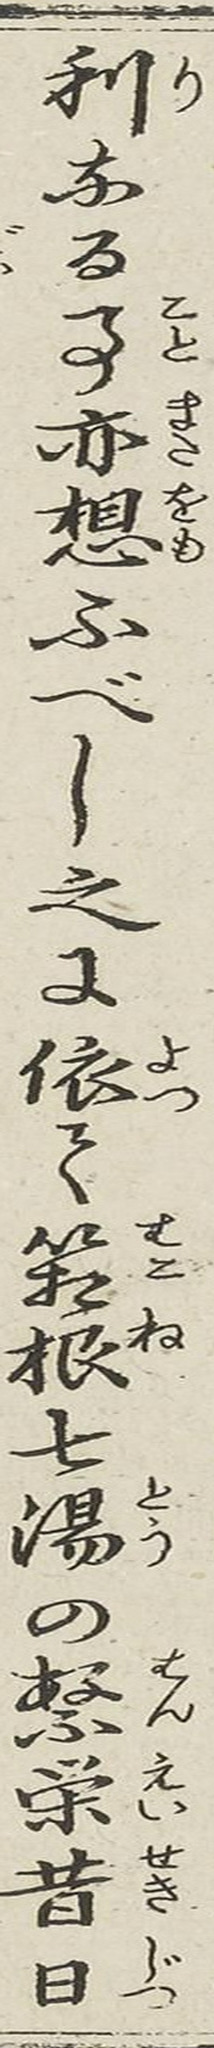利なる事亦想ふべし之に依て箱根七湯の繁栄昔日
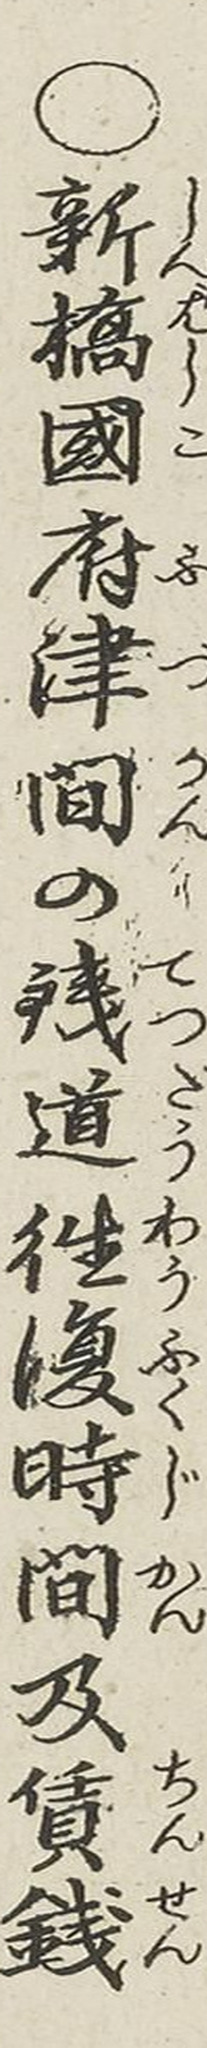○新橋国府津間の鉄道往復時間及賃銭
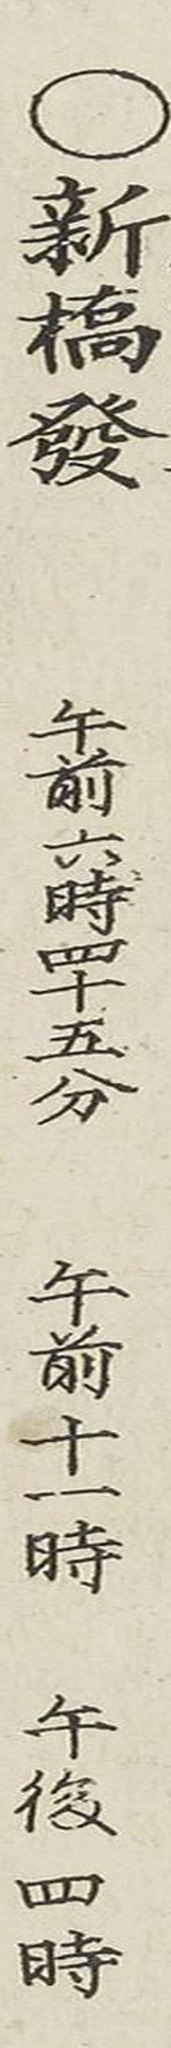○新橋発午前六時四十五分午前十一時午後四時
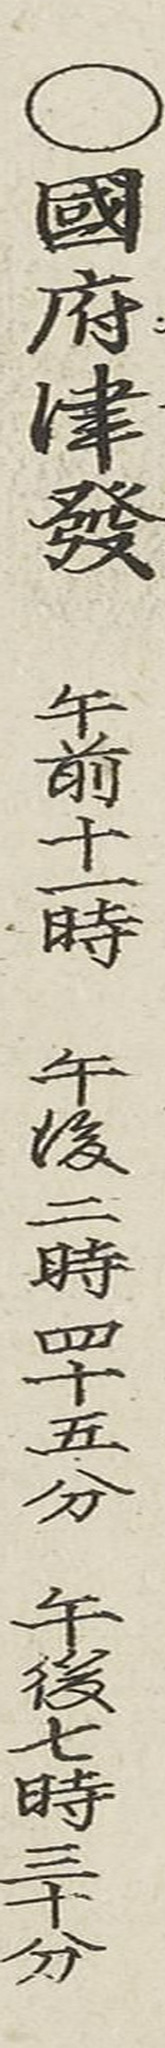○国府津発午前十一時午後二時四十五分午後七時三十分
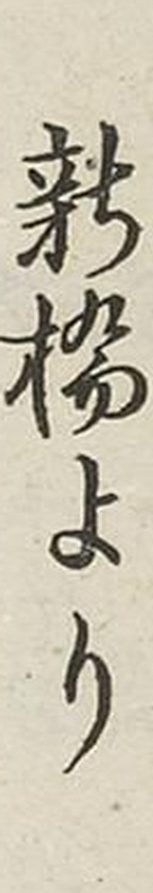新橋より
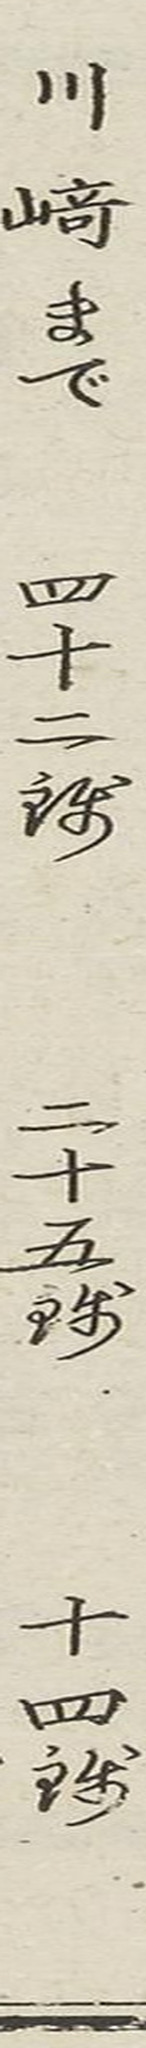川崎まで四十二銭二十五銭十四銭
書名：箱根温泉誌　全
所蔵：東京大学地震研究所図書室 Earthquake Research Institute Library, The University of Tokyo, JAPAN
